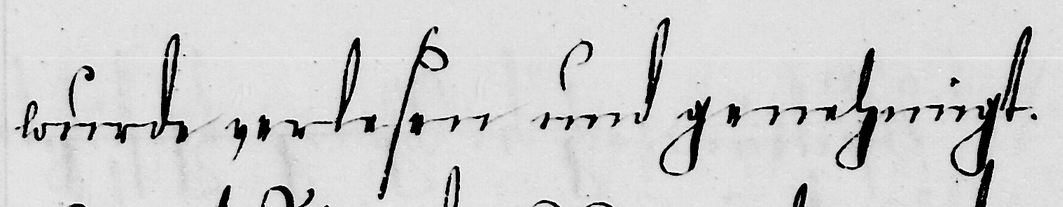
wurde verlesen und genehmigt.
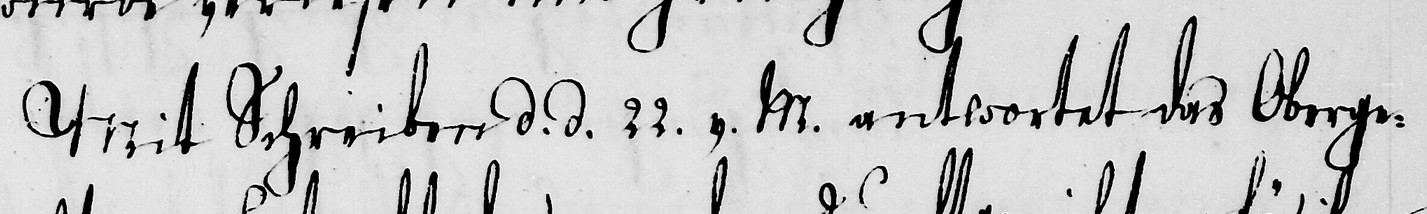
Mit Schreiben d. d. 22. v. M. antwortet das Oberger¬
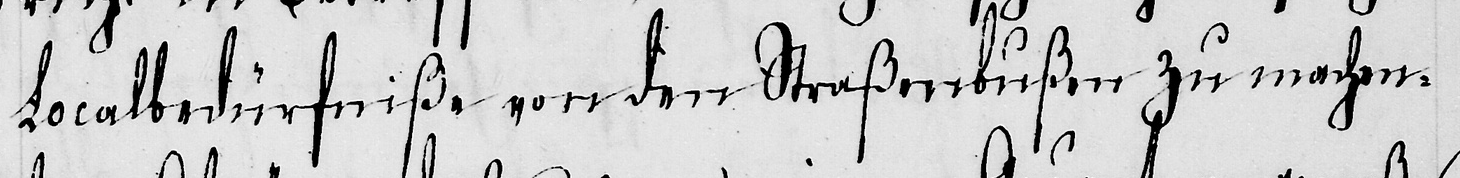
Localbedürniße von den Straßenbußen zu machen¬
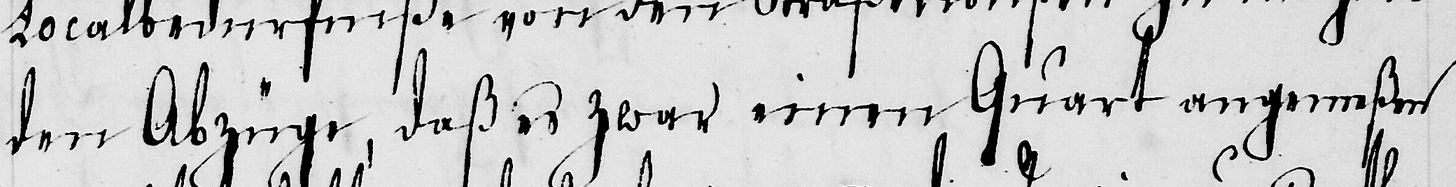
den Abzüge, daß es zwar einen Quart angemeßen
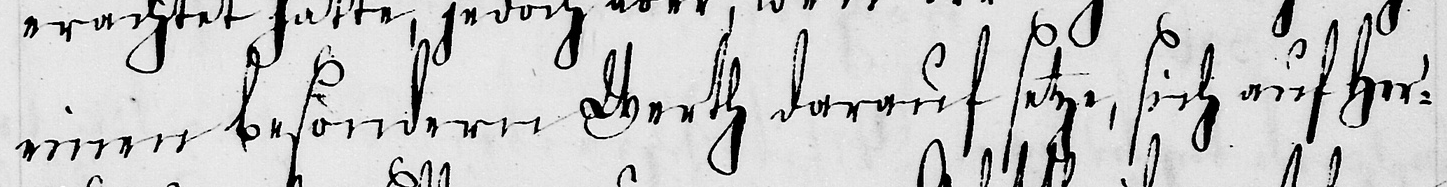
einen besondern Wert darauf setze, sich auf Her¬
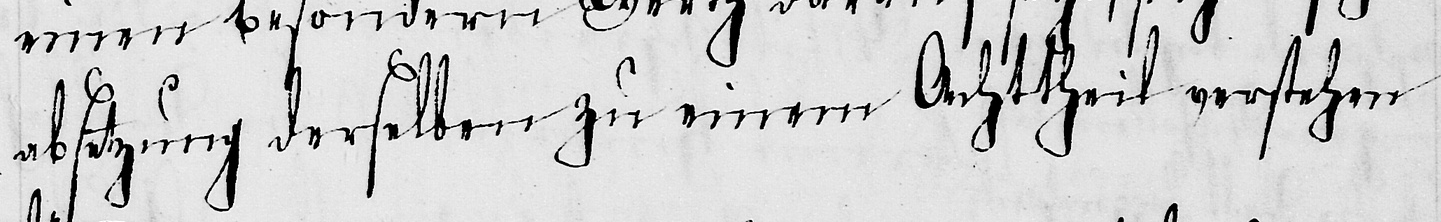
absetzung derselben zu einem Achttheil verstehen
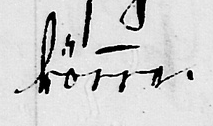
könne.
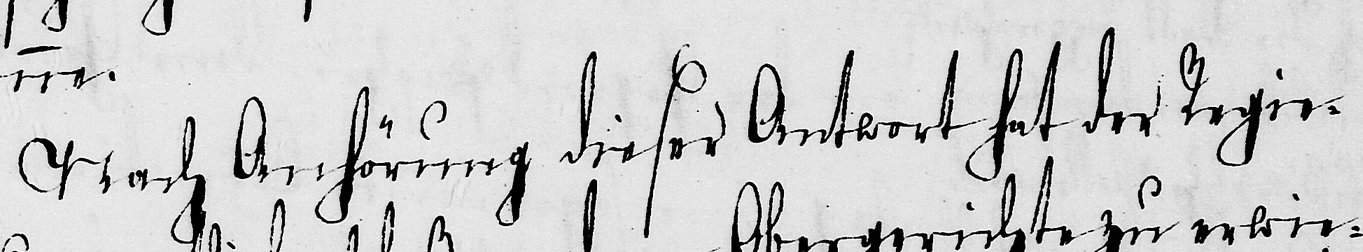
Nach Anhörung dieser Antwort hat der Regie¬
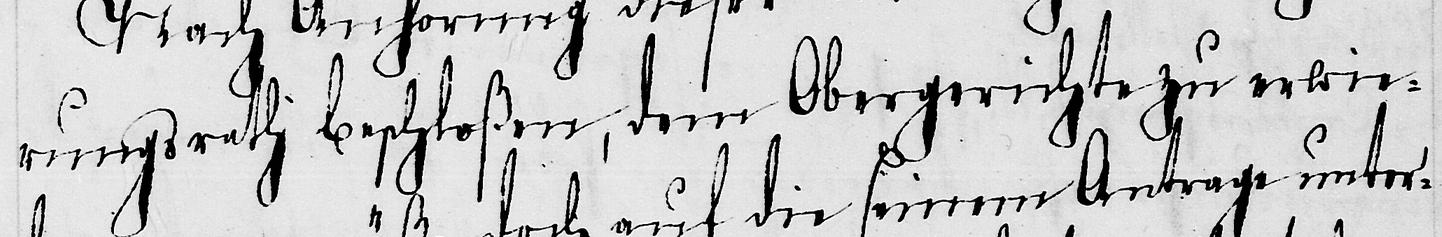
rungsrath beschloßen, dem Obergerichte zu erwie¬
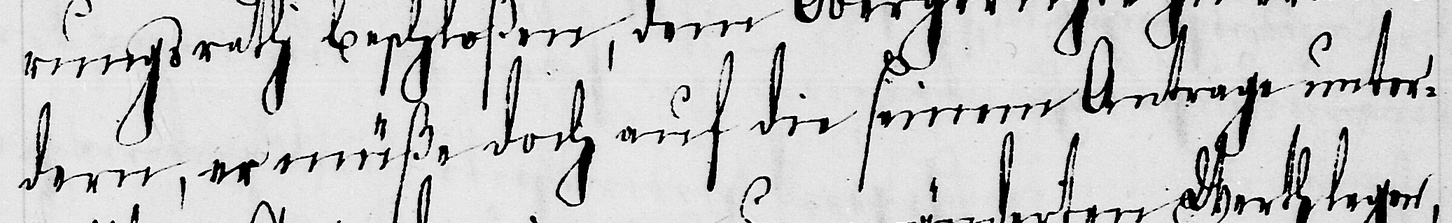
dern, er müße doch auf die seinem Antrag unters¬
